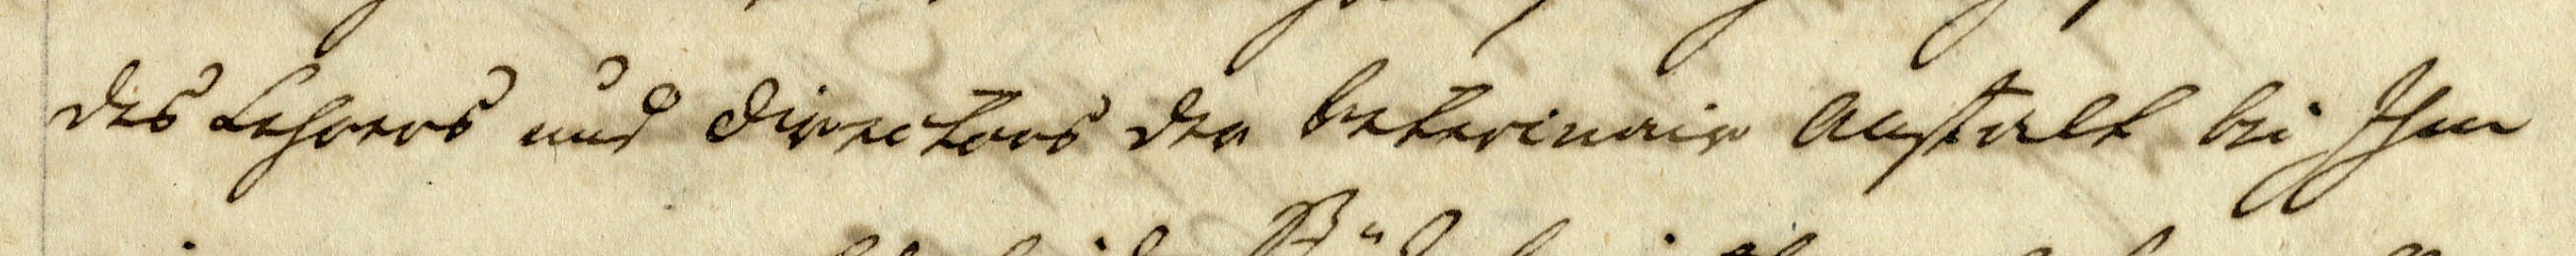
des Lehrers und Directors der Veterinair Anstalt bei Ihm
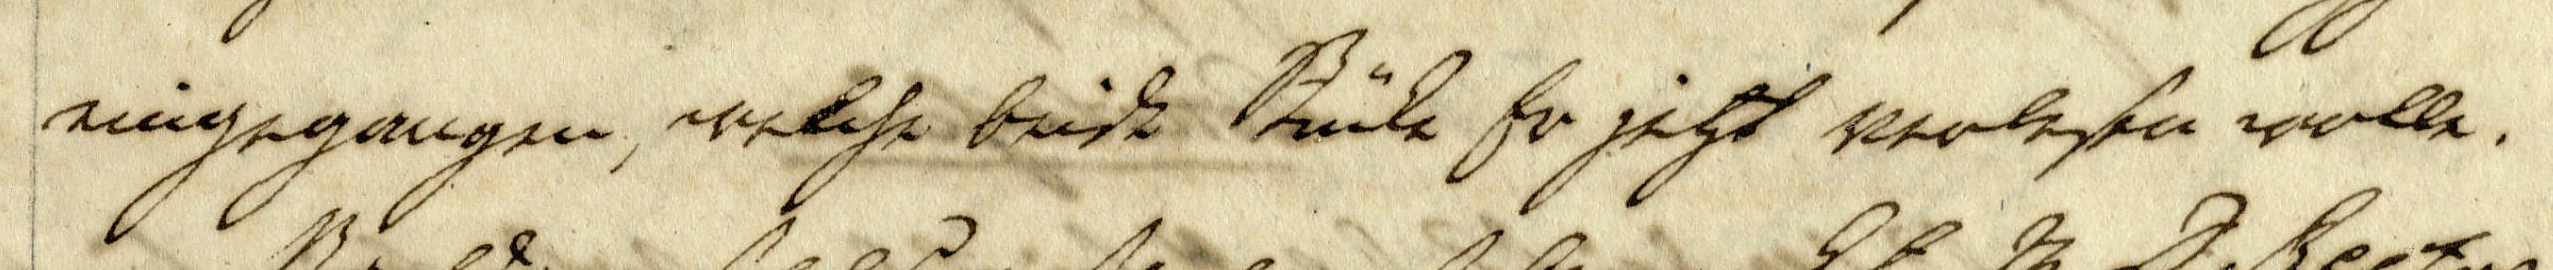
eingegangen, welche beide Stücke Er jetzt verlesen wolle.
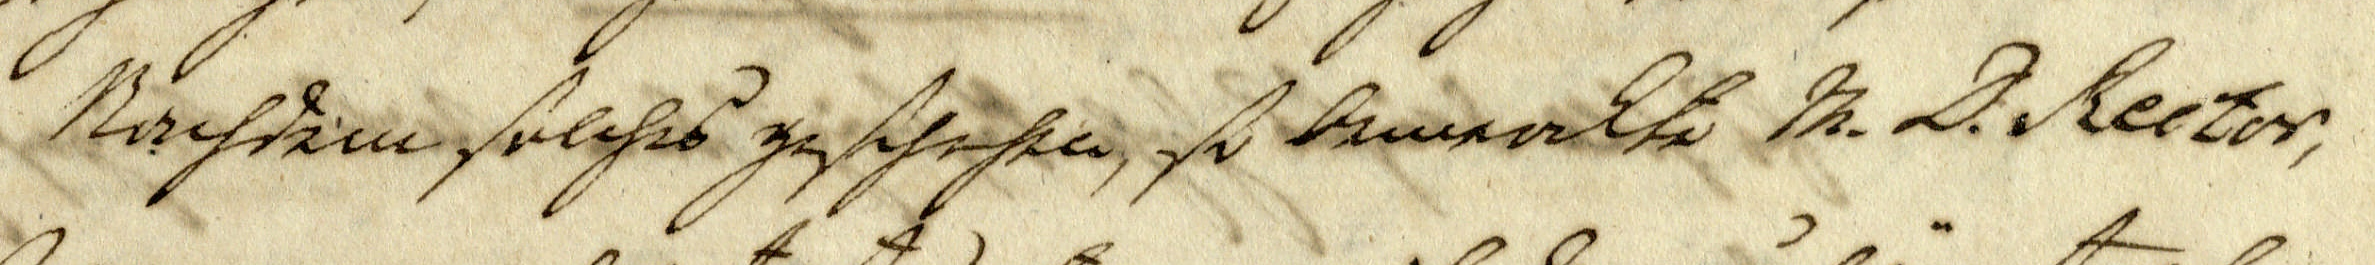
Nachdem solches geschehen, so bemerckte M. D. Rector,
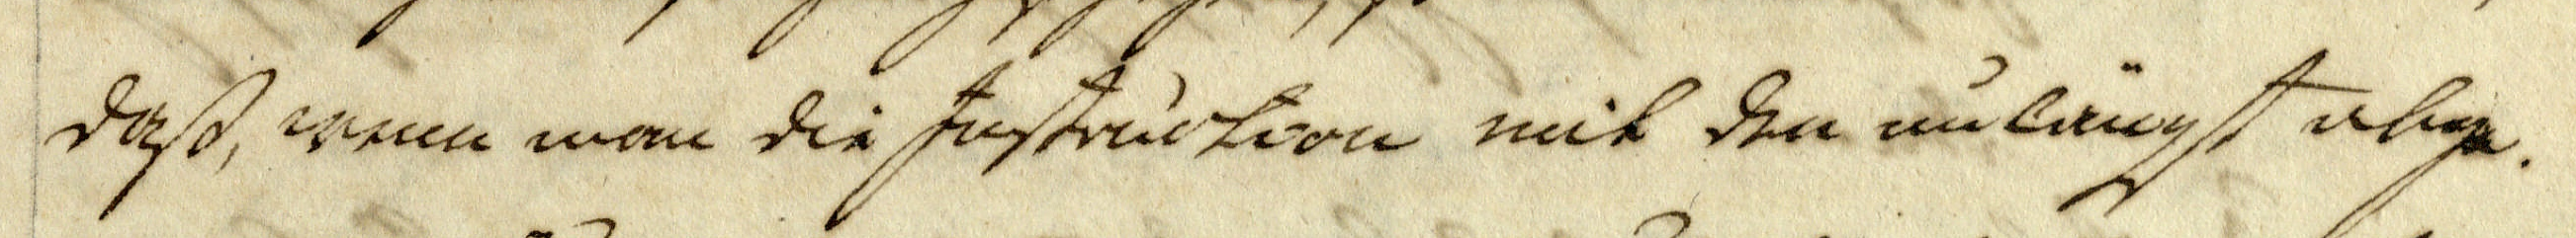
daß, wenn man die Instruction mit den unlängst abge¬
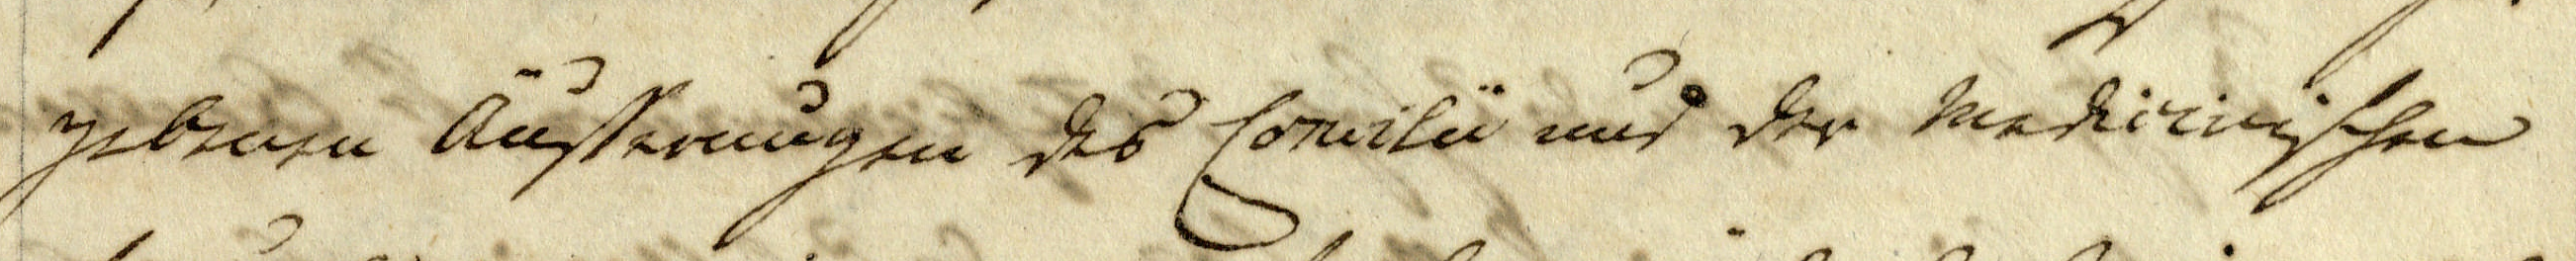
gebenen Äusserungen des Concilii und der Medicinischen
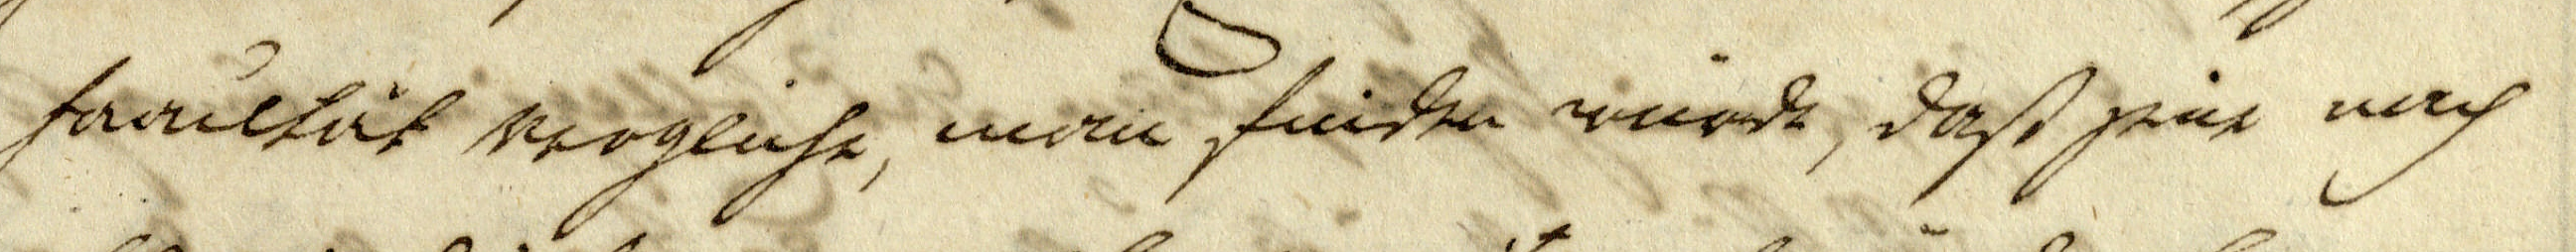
Facultät vergleiche, man finden würde, daß jene nach
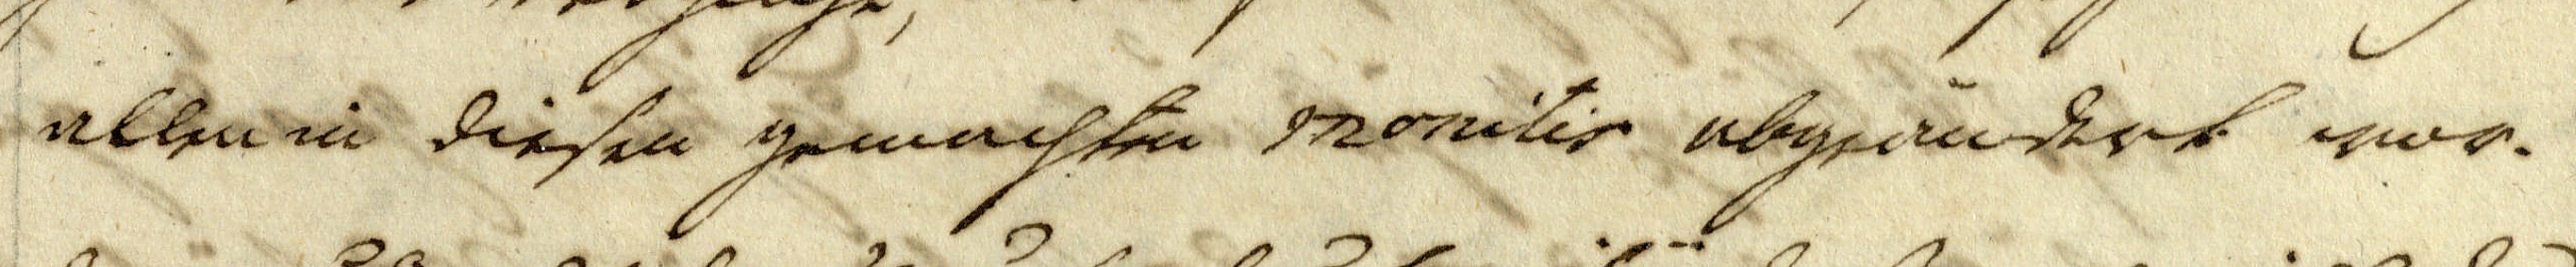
allen in diesen gemachten monitis abgeändert wor¬
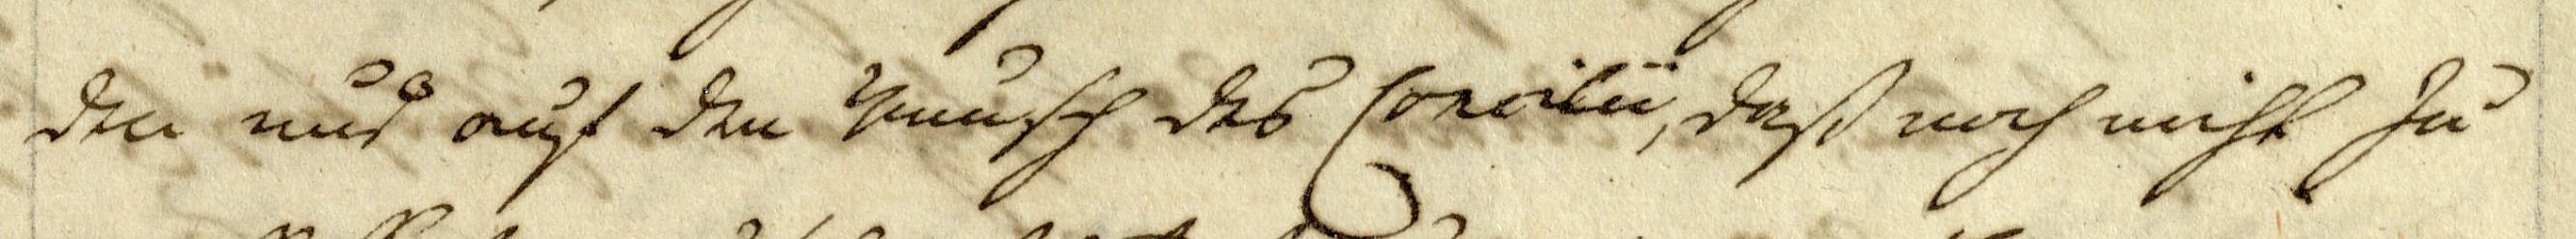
den und auf den Wunsch des Concilii, daß noch nicht zu
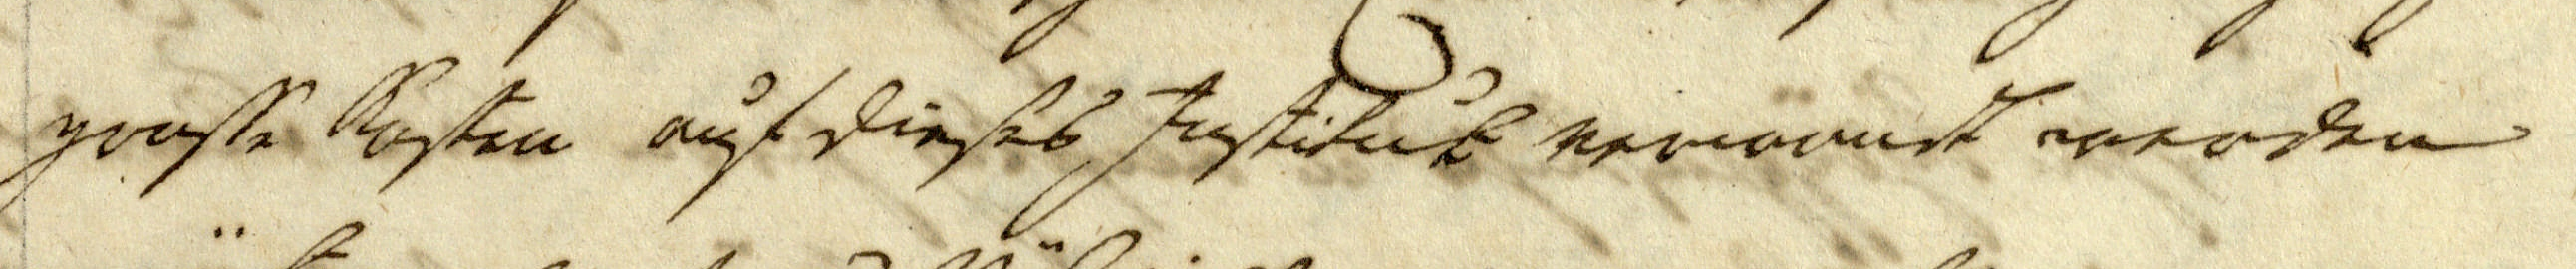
grosse Kosten auf dieses Institut verwandt werden
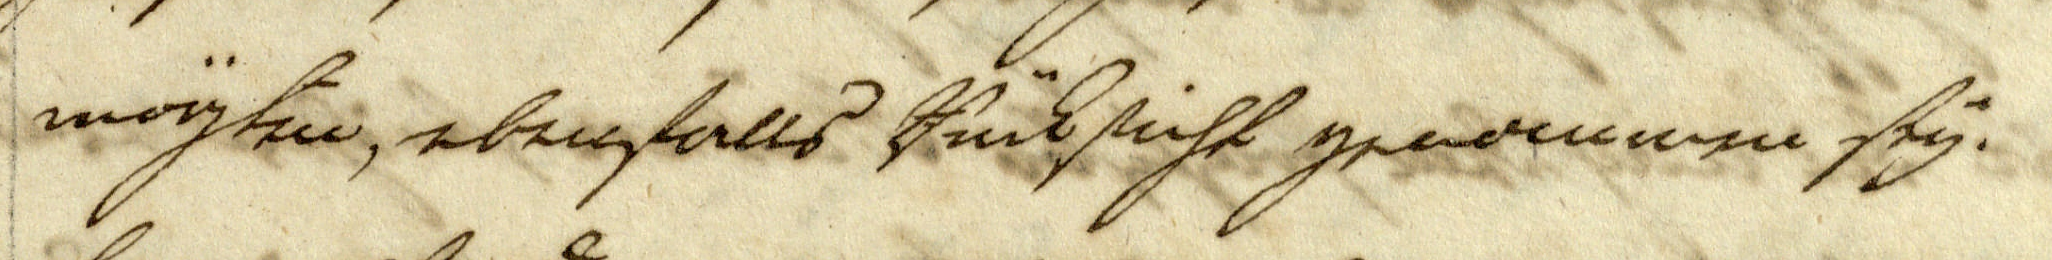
mögten, ebenfalls Rücksicht genommen seÿ.
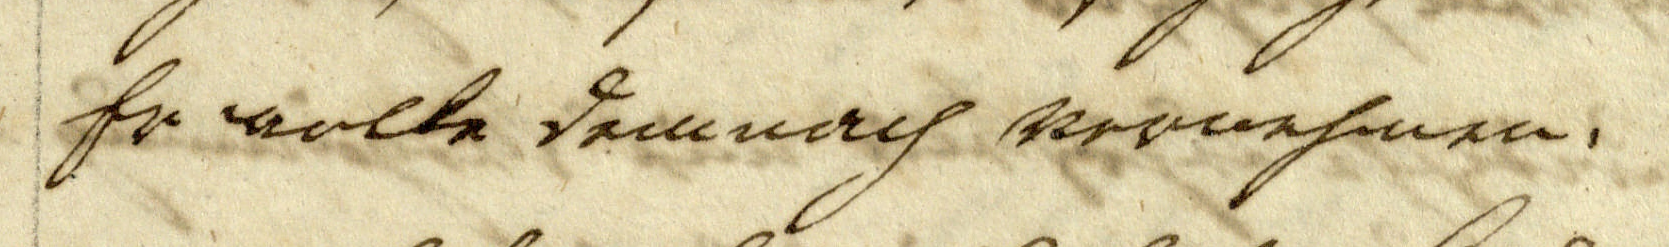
Er wolle demnach vernehmen:
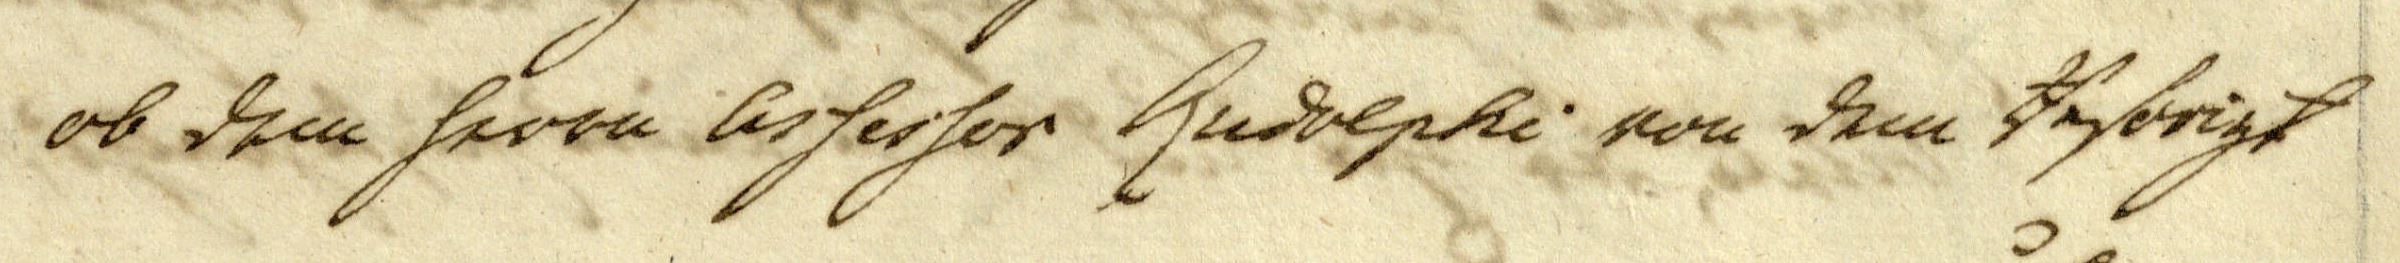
ob dem Herrn Assessor Rudolphi von dem Rescript
